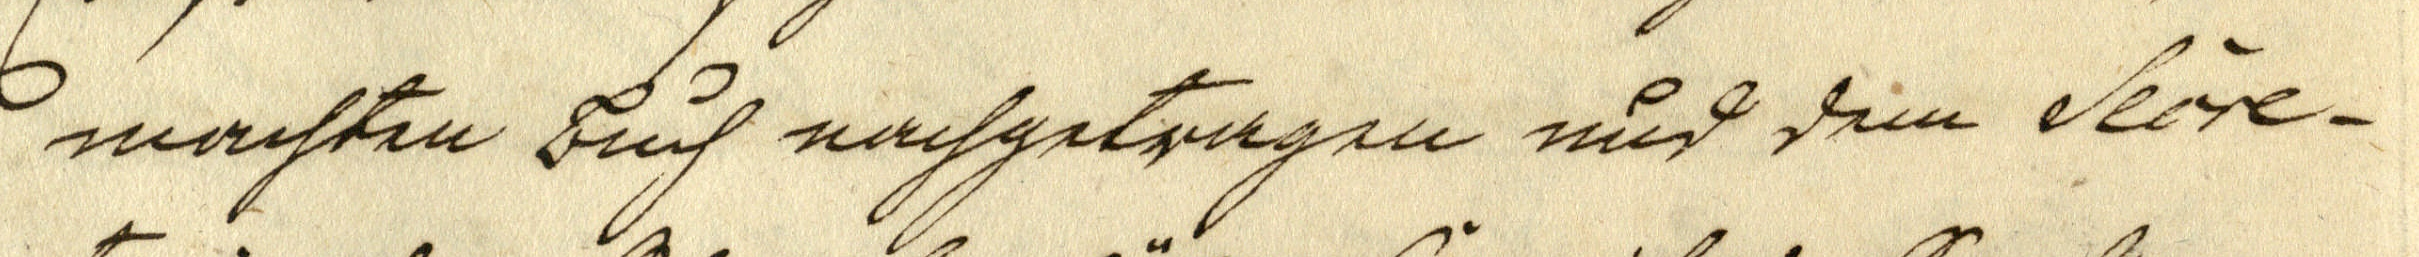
machten Buch nachgetragen und dem Secre-
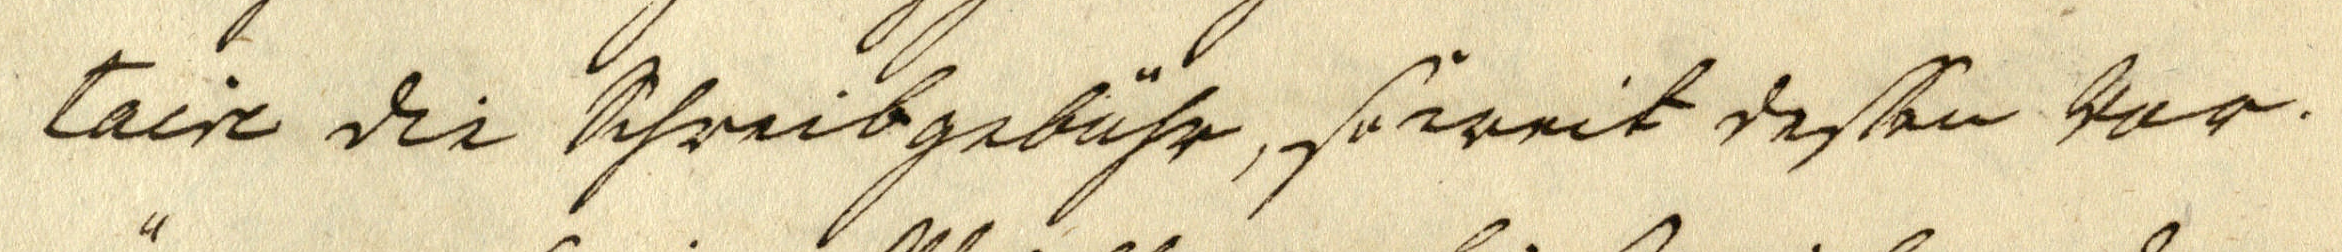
taire die Schreibgebühr, soweit dessen Vor-
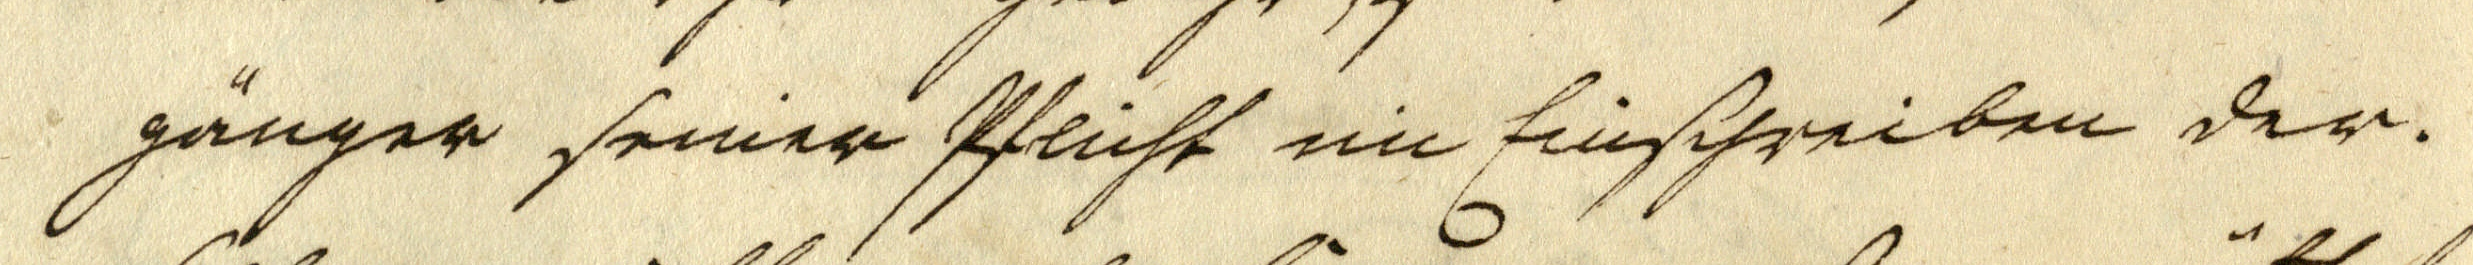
gänger seiner Pflicht im Einschreiben der-
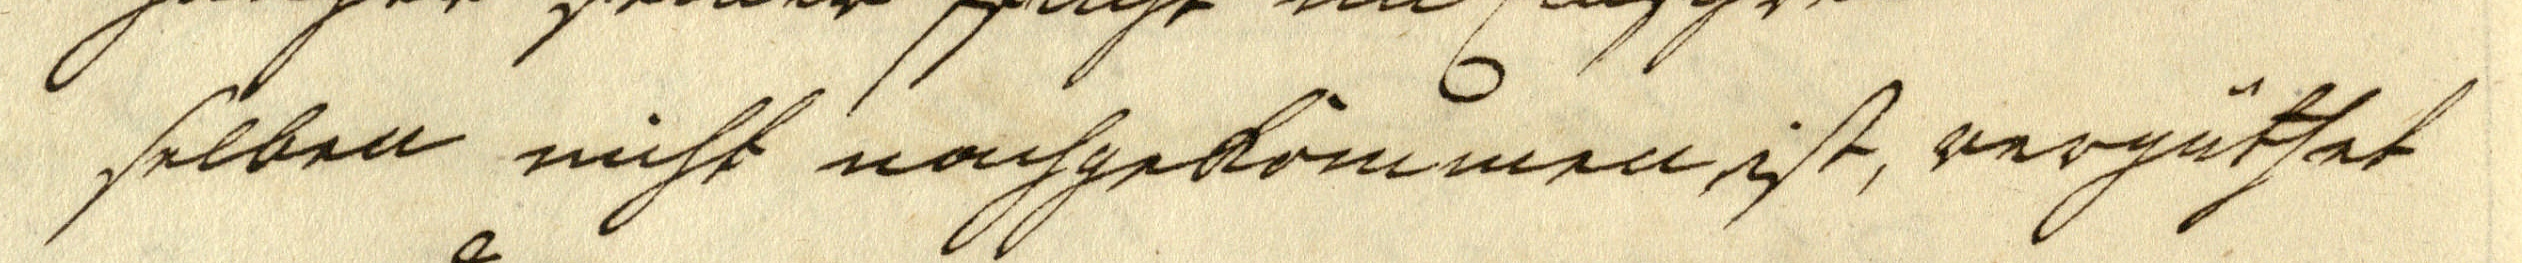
selben nicht nachgekommen ist, vergüthet
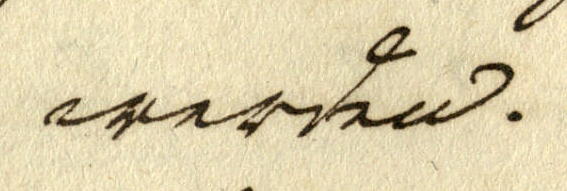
werden
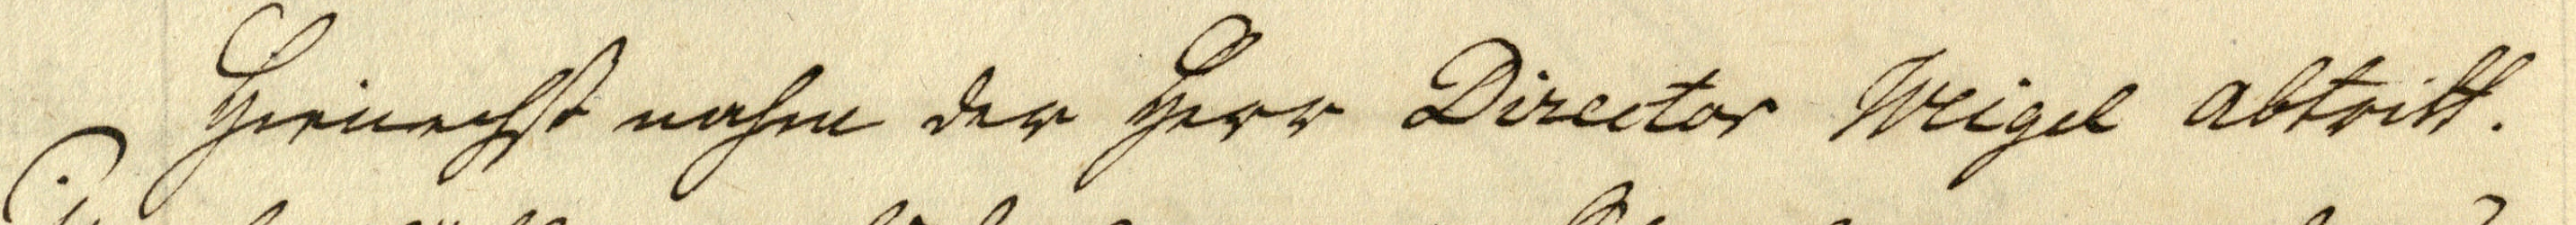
Hienechst nahm der Herr Director Weigel Abtritt.
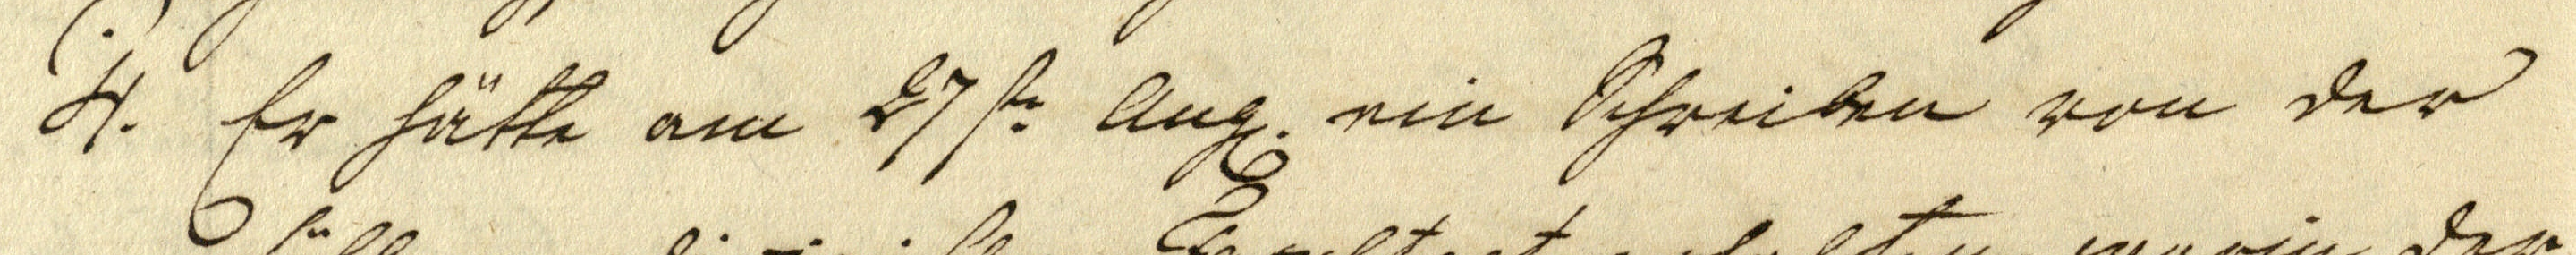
4. Er hätte am 27sten Aug. ein Schreiben von der
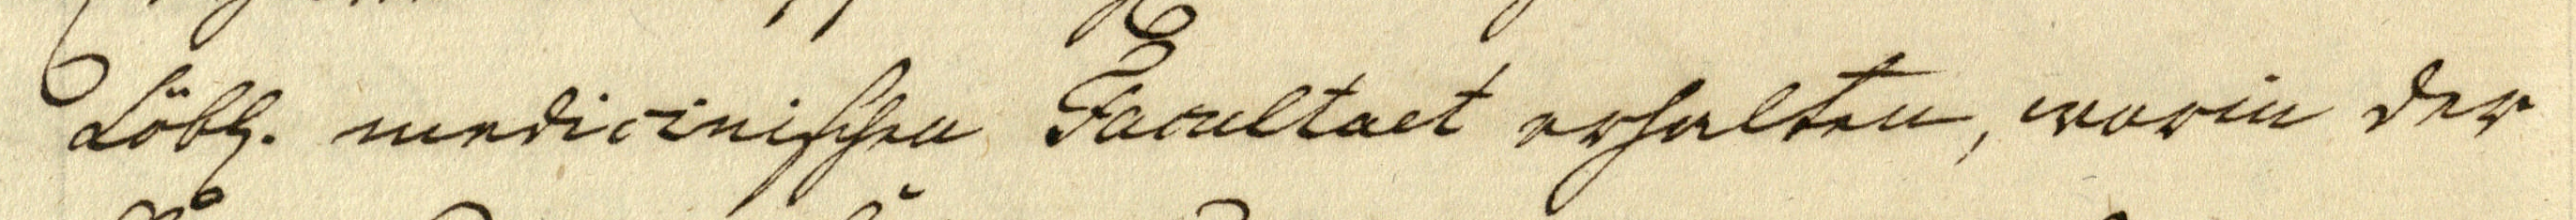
Löbl. medicinischen Facultät erhalten, worin der
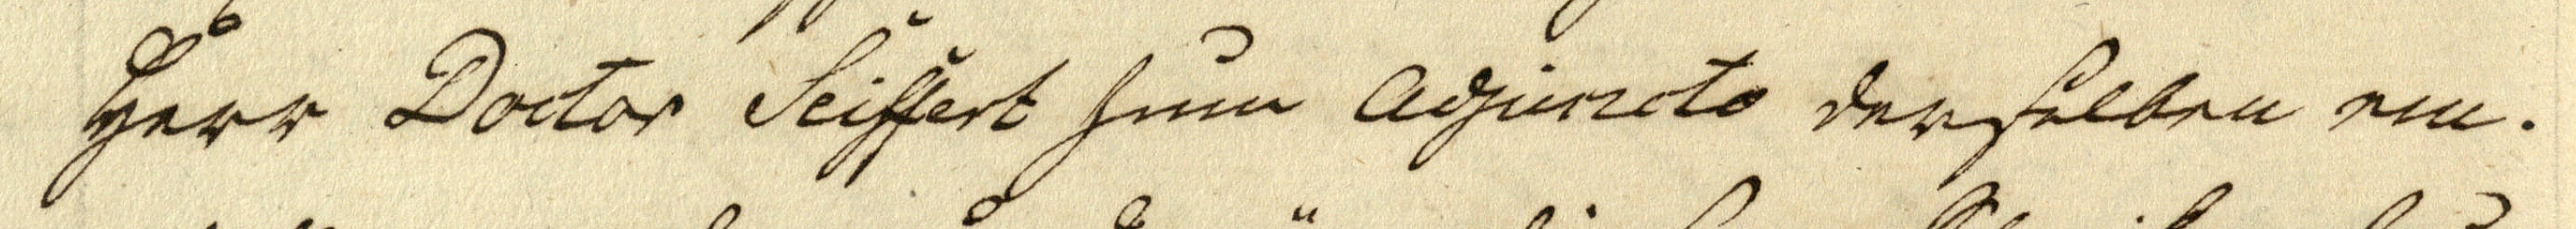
Herr Doctor Seiffert zum Adjuncto derselben em-
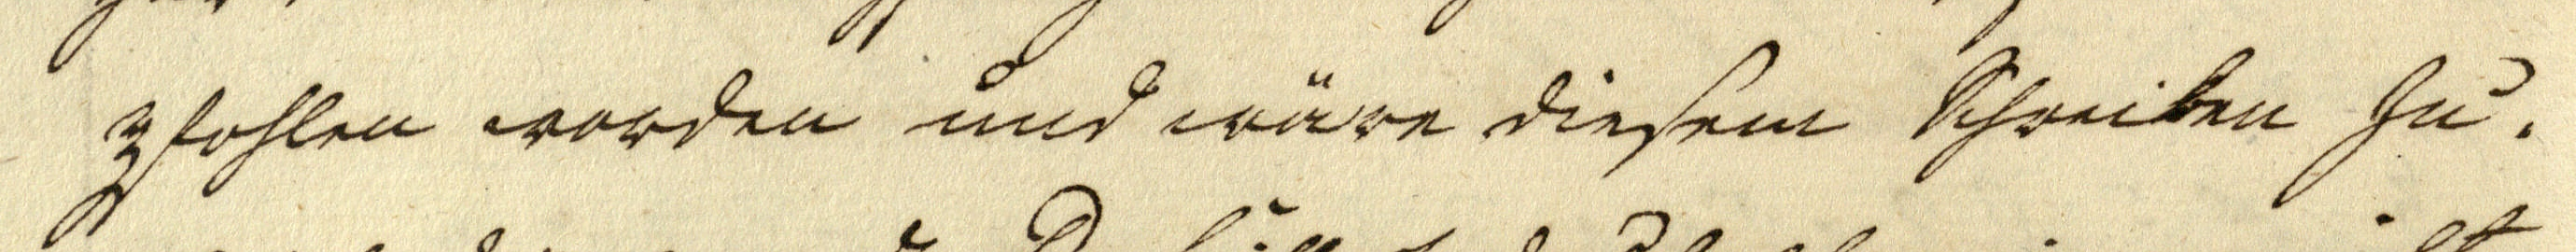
pfohlen worden und wäre diesem Schreiben zu-
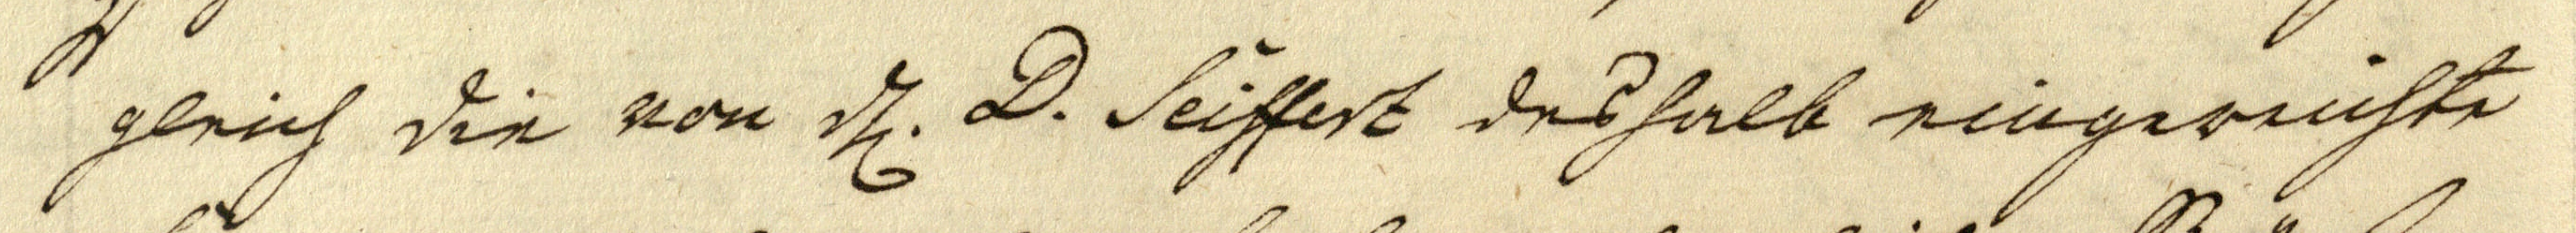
gleich die von dh. D. Seiffert deshalb eingereichte
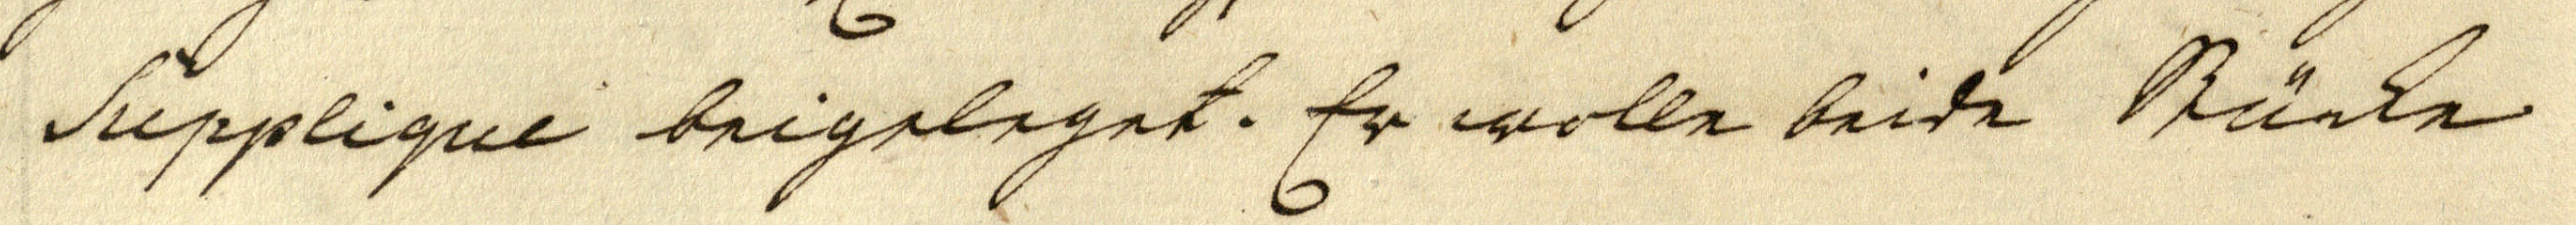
Supplique beigeleget. Er wolle beide Stücke
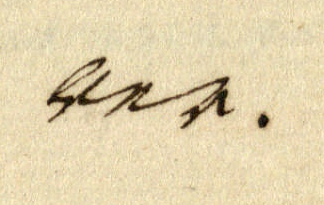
ver-
